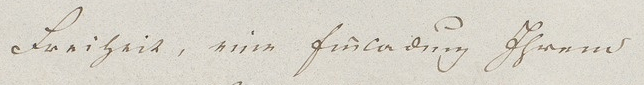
Freiheit, eine Einladung Ihrem
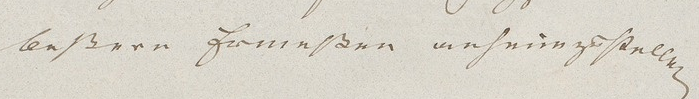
beßern Ermeßen anheimzustellen.
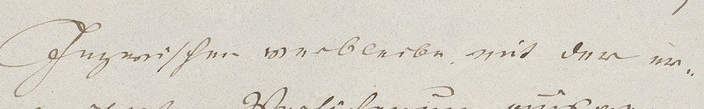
Inzwischen verbleibe mit der er-
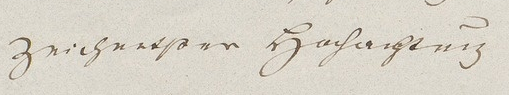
zeichnetster Hochachtung
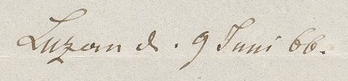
Luzern d. 9 Juni 66.
